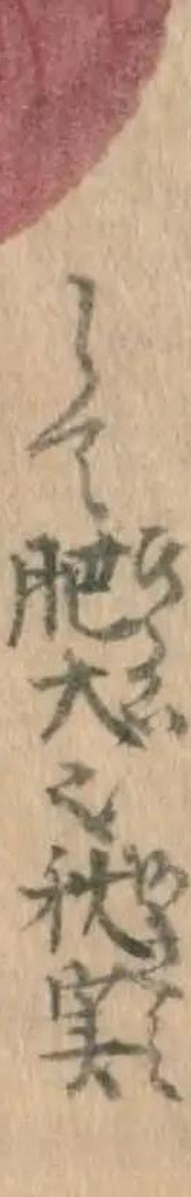して肥大也秋実
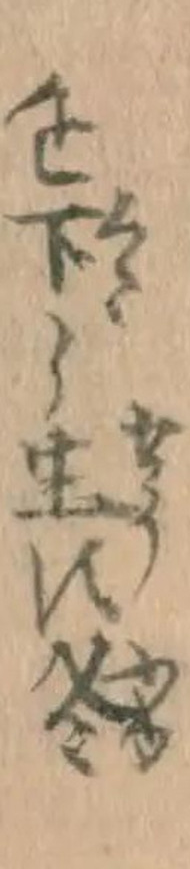を下し生す冬
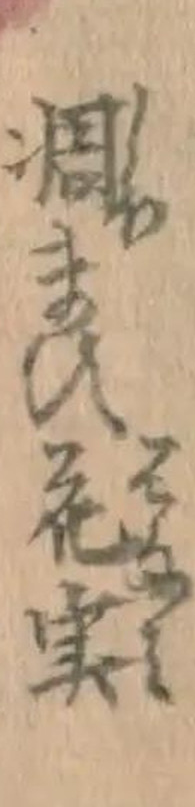凋ます花実
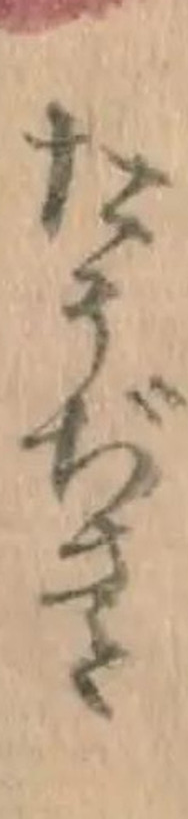たうぢさと
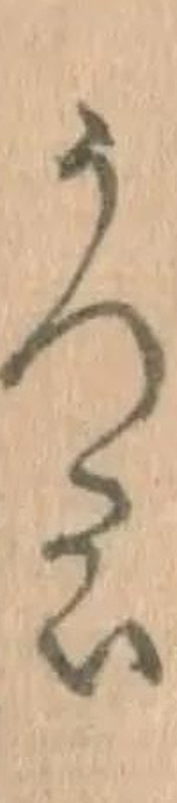うつたい
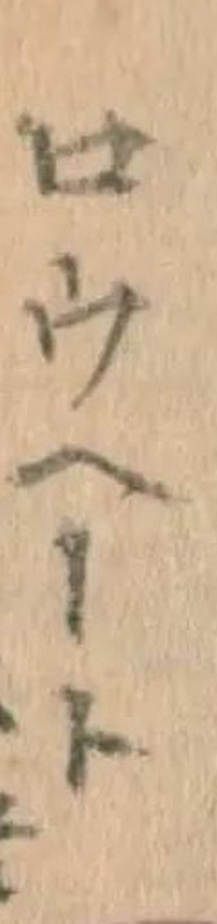ロウヘート
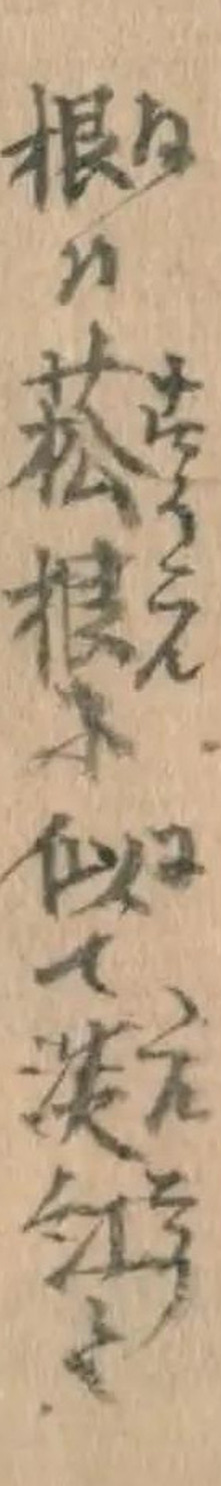根は菘根に似て淡紅と
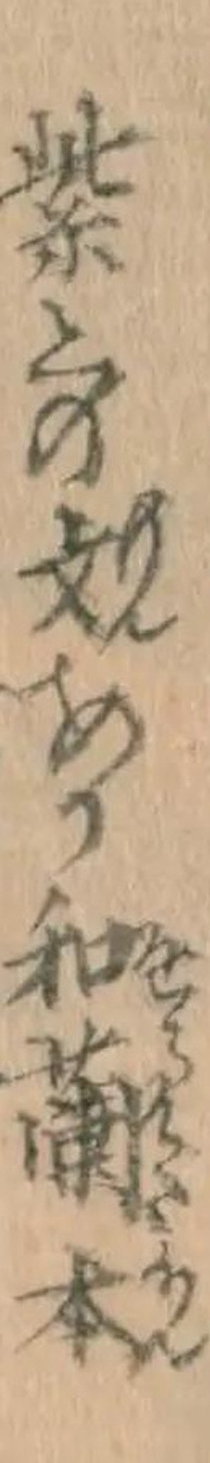紫との文あり和蘭本
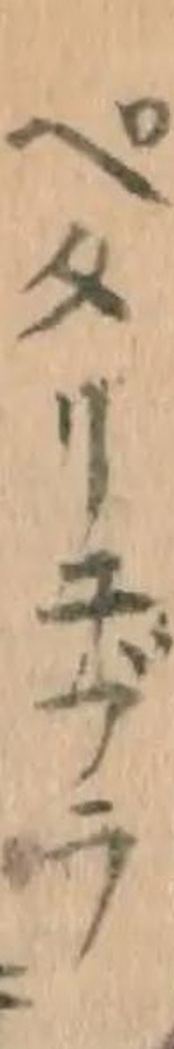ペタリユブラ
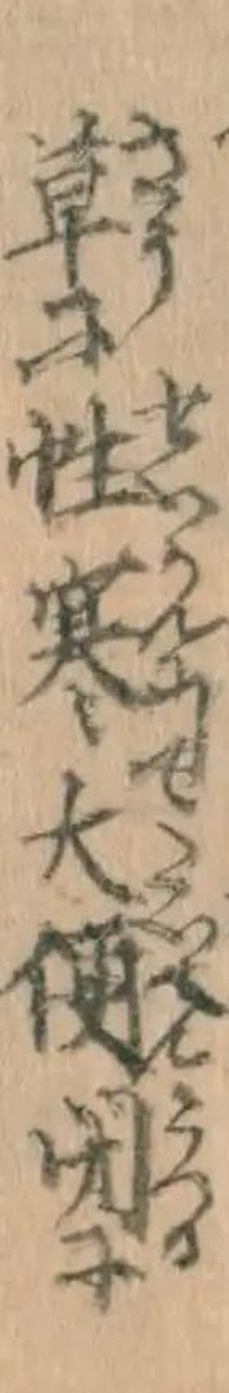草に性寒大便閉に
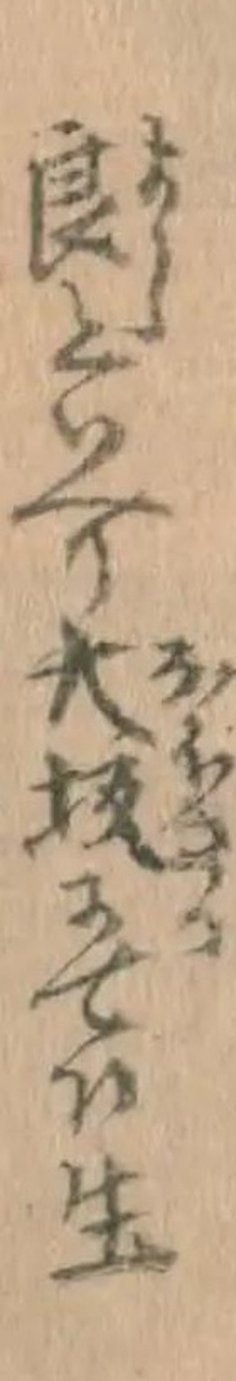良といへり大坂にては生
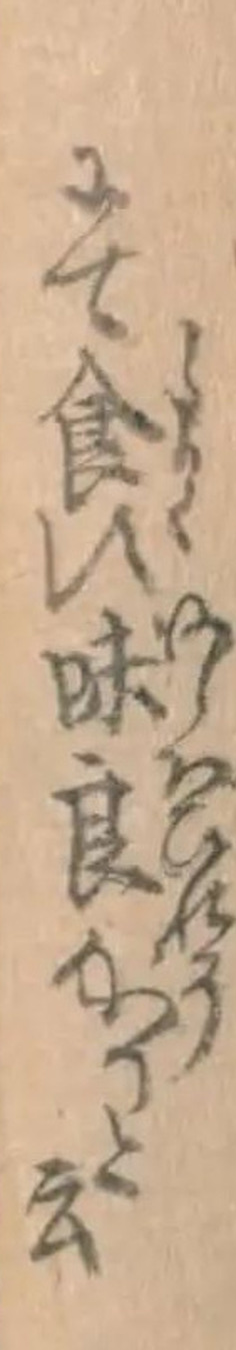にて食す味良なりと云
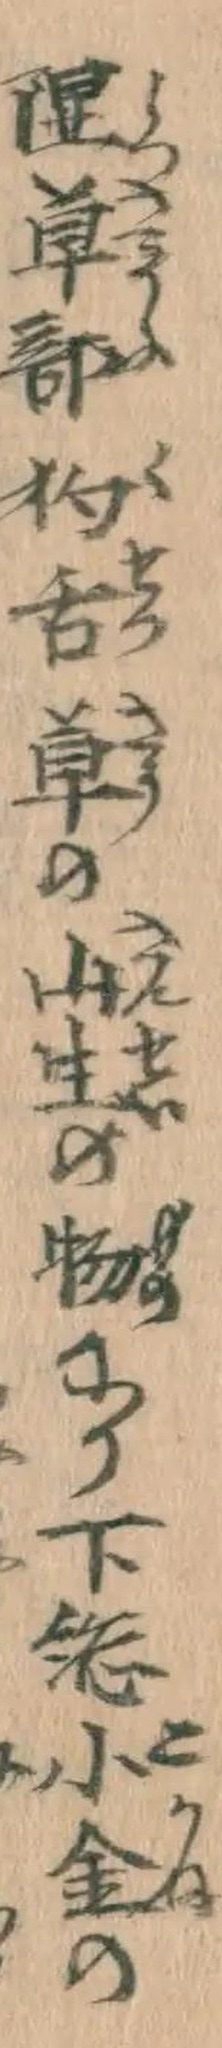隰草部狗舌草の山生の物なり下総小金の
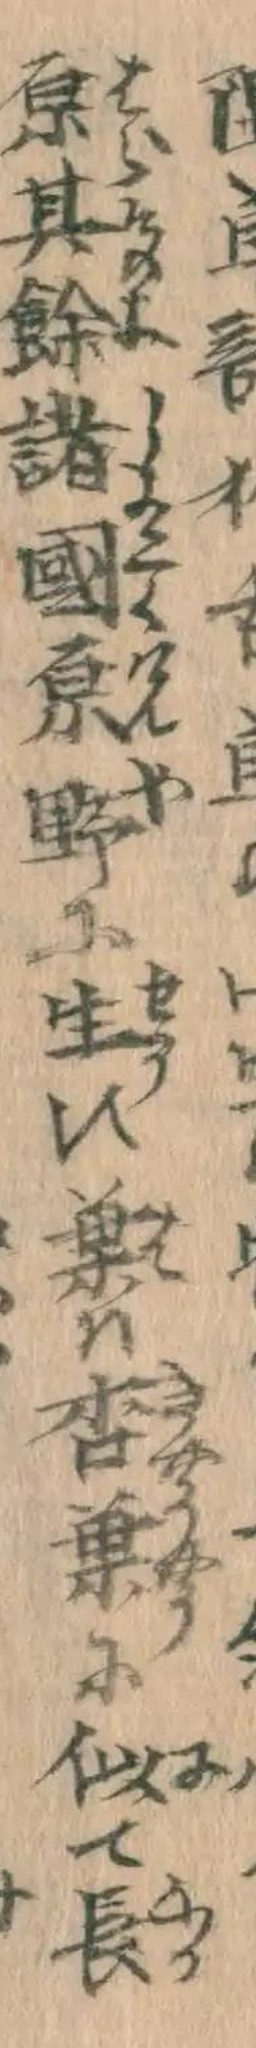原其余諸国原野に生す葉は杏葉に似て長
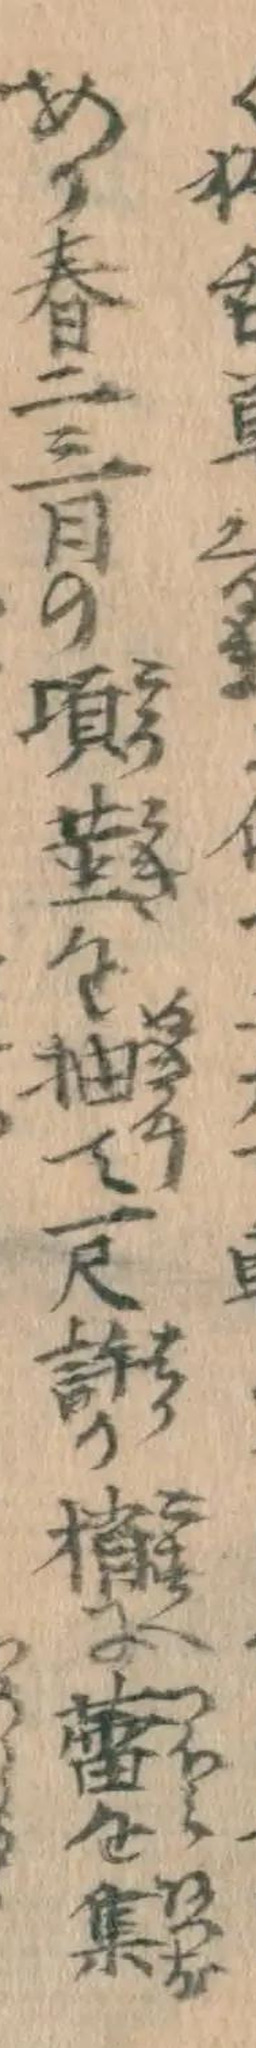あり春二三月の頃茎を抽て一尺許り梢に蕾を集

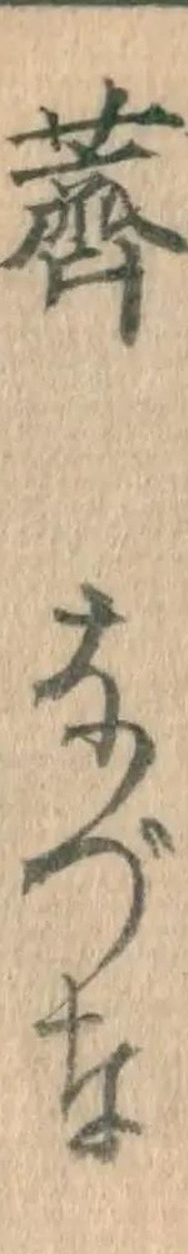薺なづな
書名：本草図譜. 巻46-48
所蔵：国立国会図書館 National Diet Library, JAPAN
